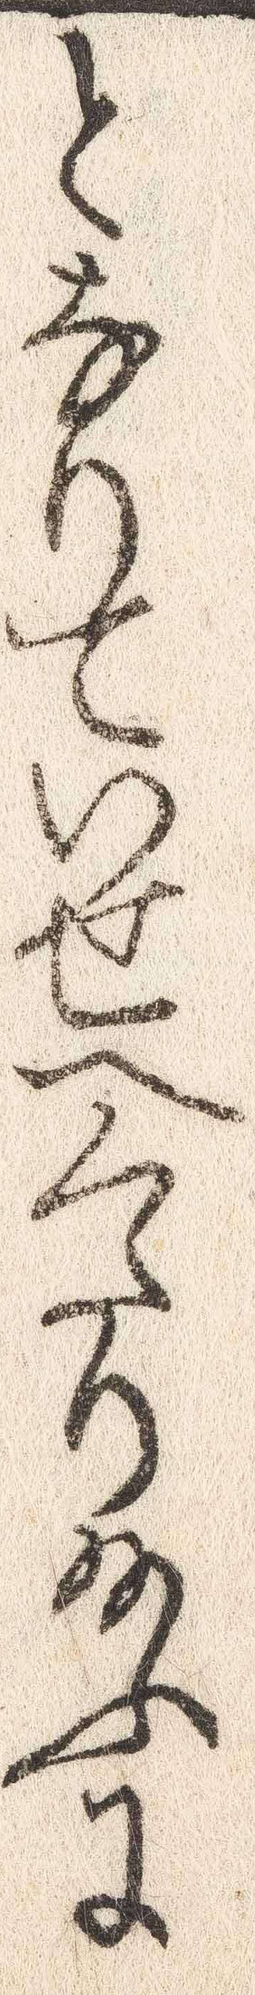となりていせへくたり給ふに
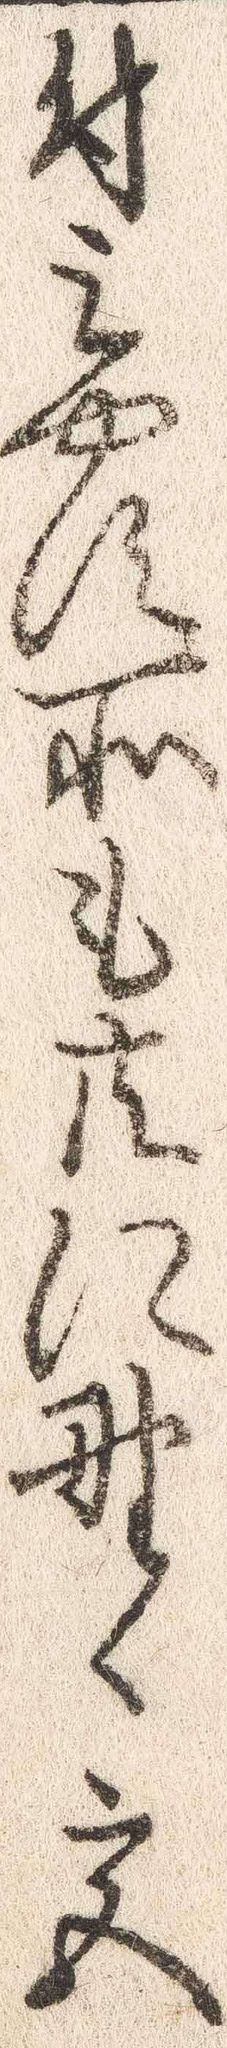付みやす所も共に野々宮
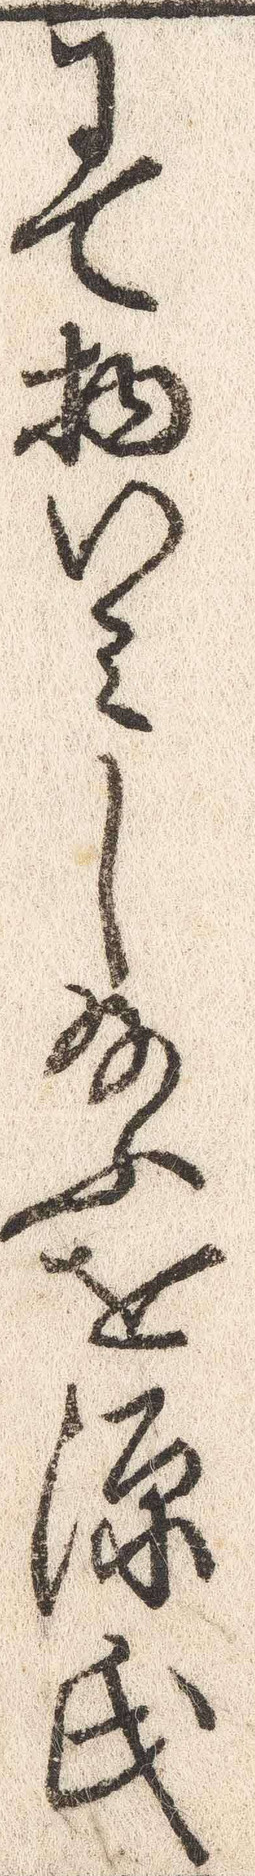にて物いみし給ふを源氏
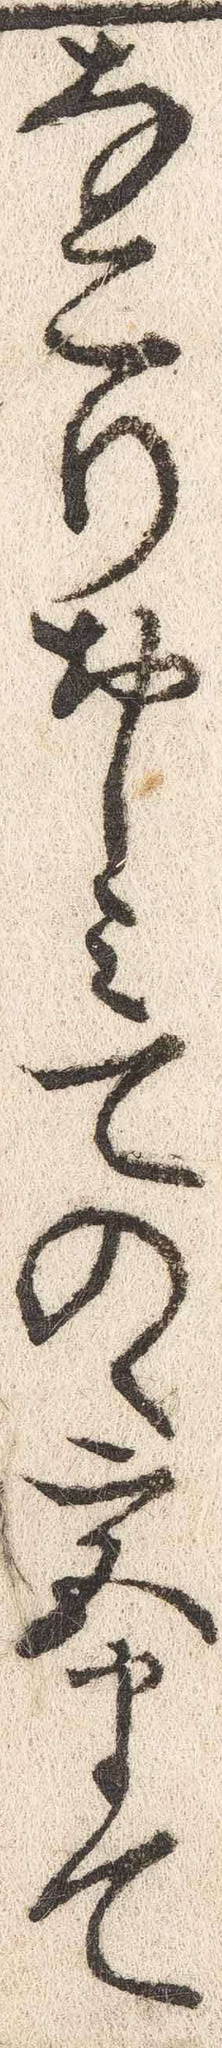なこりおしみてのゝ宮まて

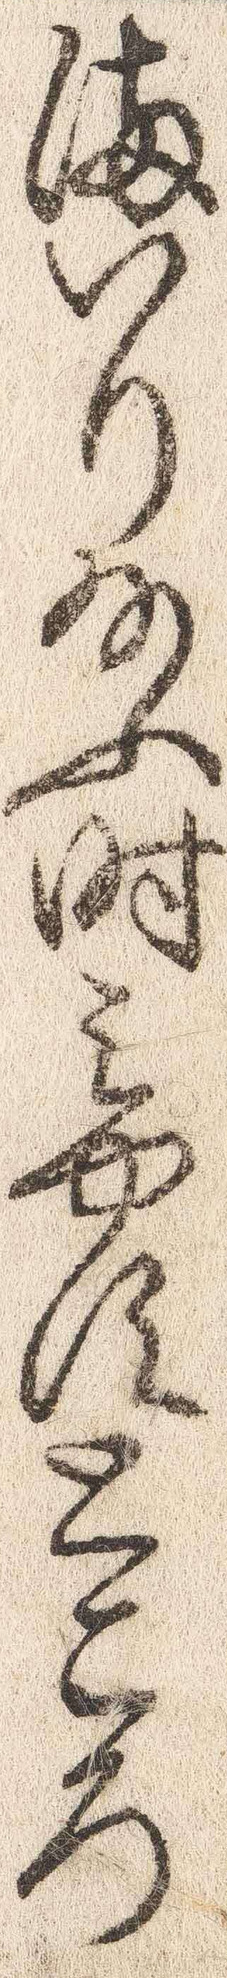まいり給ふ時みやすところ
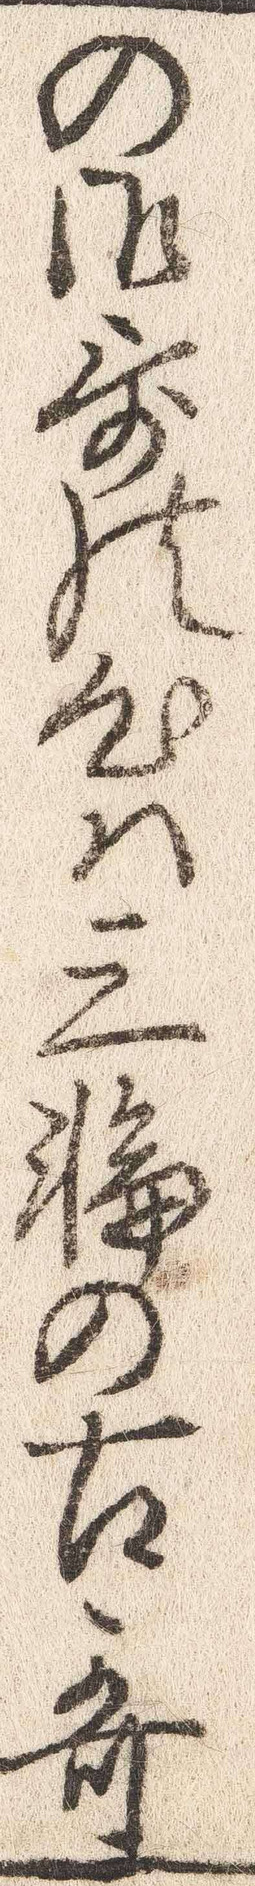の御歌の心は三輪の古歌
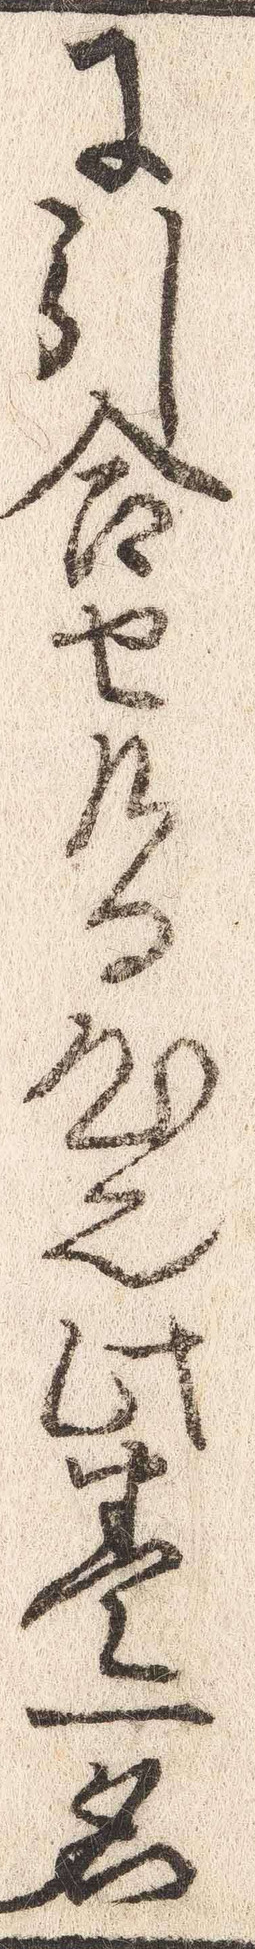に引合せける心也此巻一名
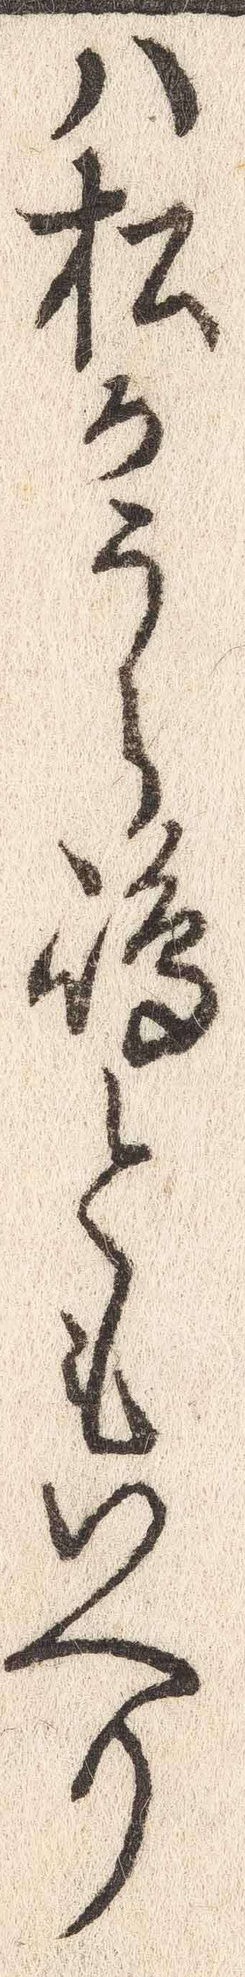は松かうら嶋ともいへり
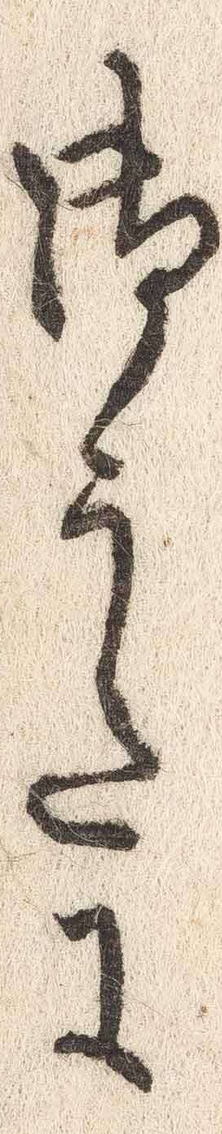御うたに
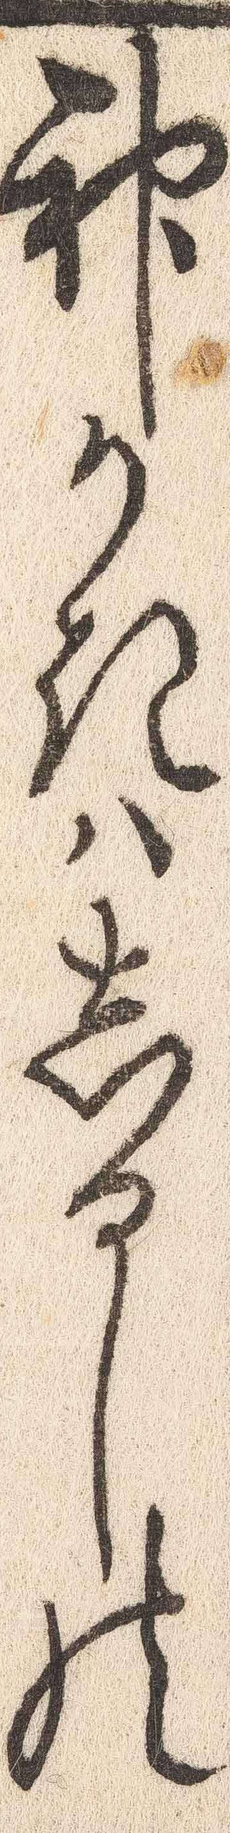神かきはしるしの
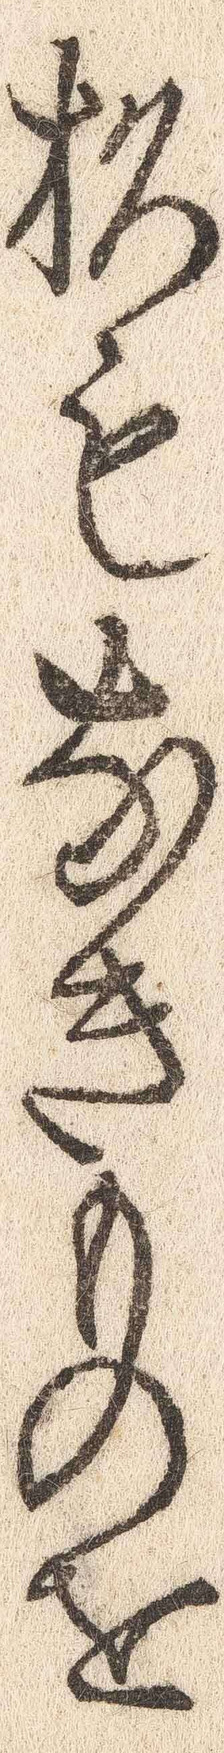杉もなきものを
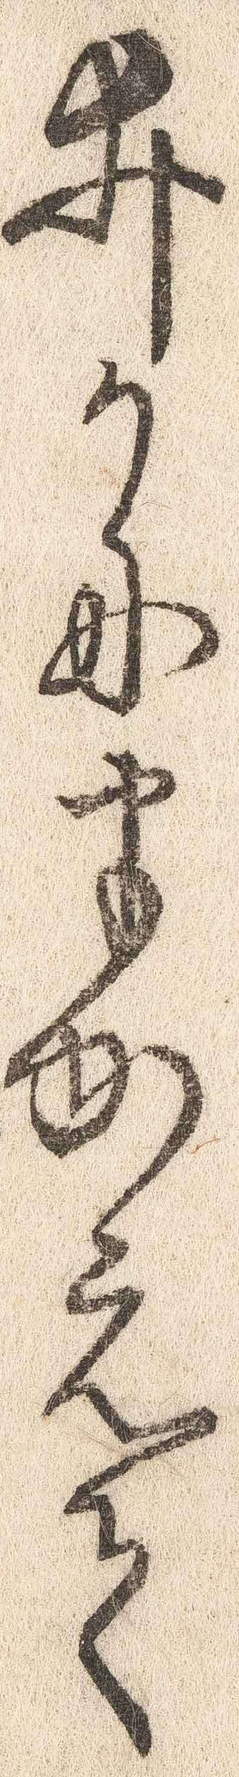いかにまかえて
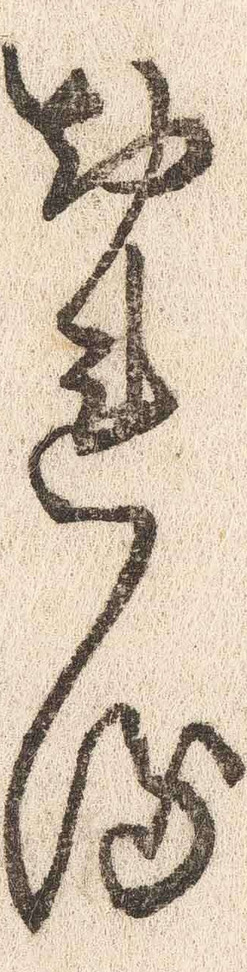おれる

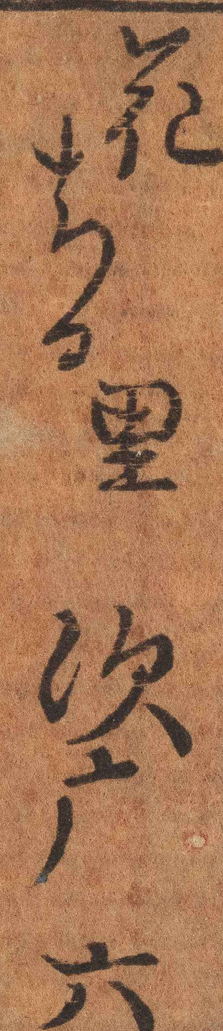花ちる里須磨六

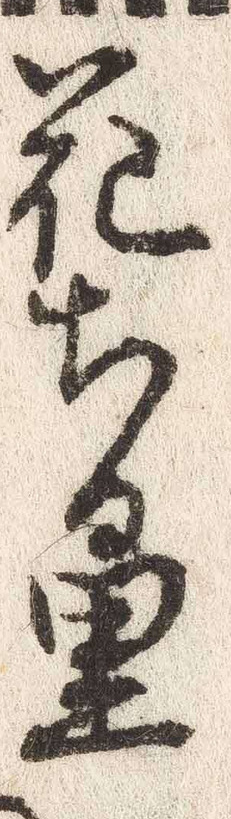花ちる里

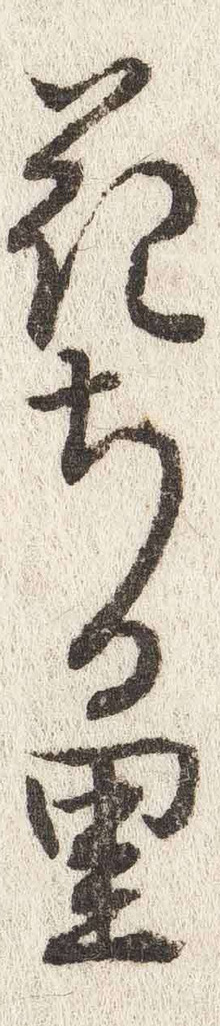花ちる里
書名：源氏物語
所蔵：東京学芸大学附属図書館 国文学研究資料館
